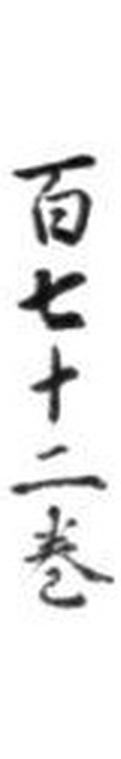百七十二巻
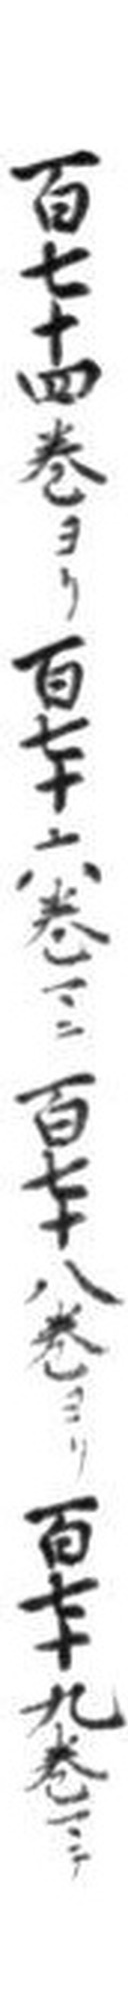百七十四巻ヨリ百七十六巻マテ百七十八巻ヨリ百七十九巻マテ
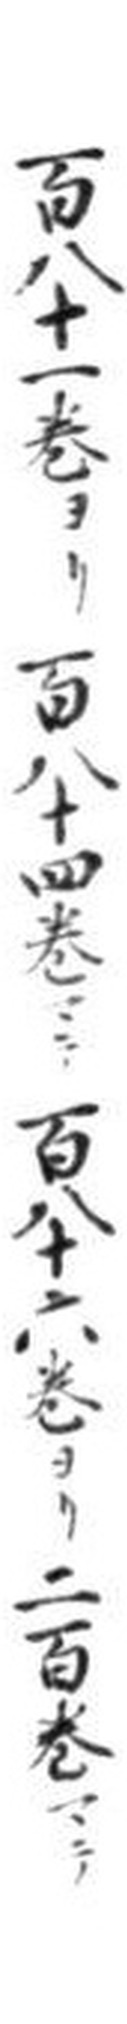百八十一巻ヨリ百八十四巻マテ百八十六巻ヨリ二百巻マテ
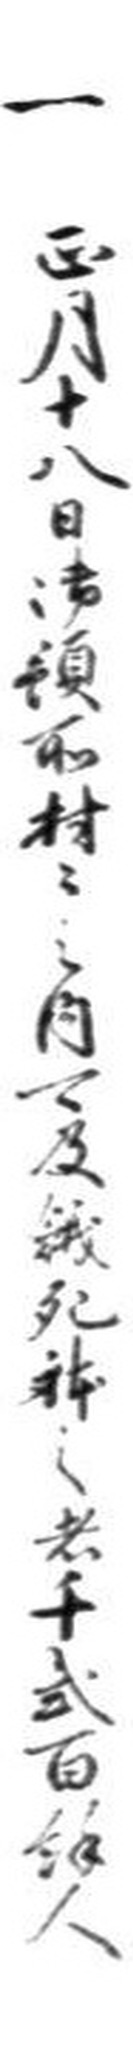一正月十八日御預所村々之内可及餓死体之者千弐百余人
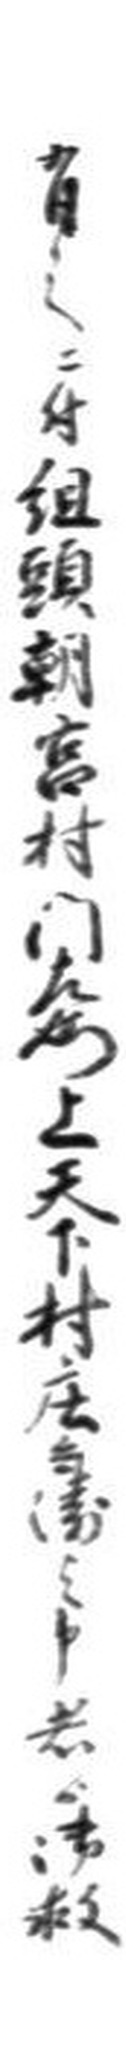有之ニ付組頭朝宮村門左衛門上天下村庄兵衛与申者ゟ御救
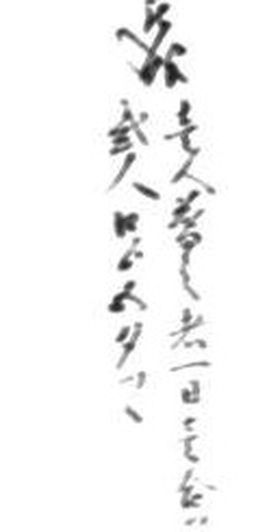弐人口ゟ五勺ツヽ
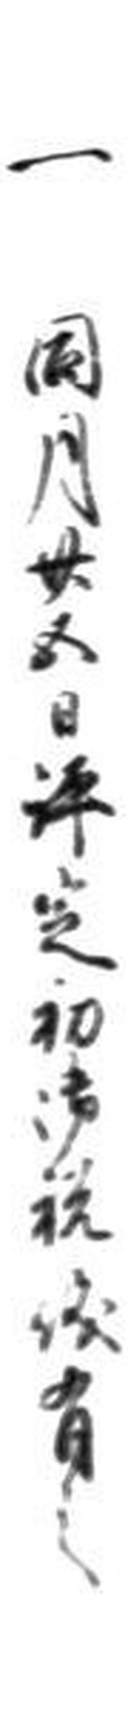一同月廿五日評定初御祝儀有之
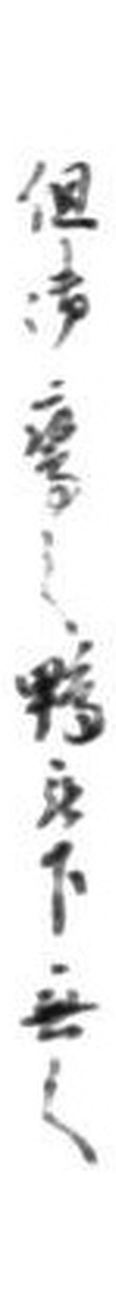但御鷹之鴨被下無之
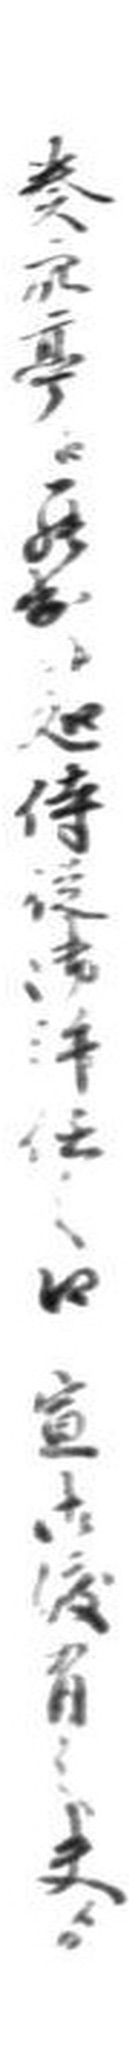奏衆亭江罷出候処侍従御拝任之口宣御渡有之夫ゟ
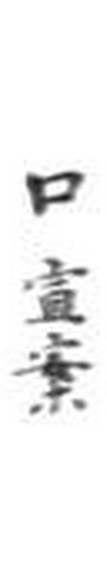口宣案
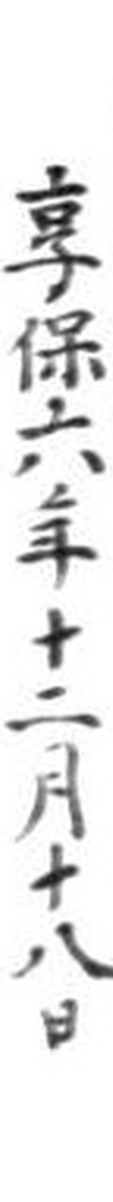享保六年十二月十八日

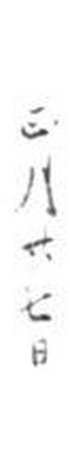正月廿七日
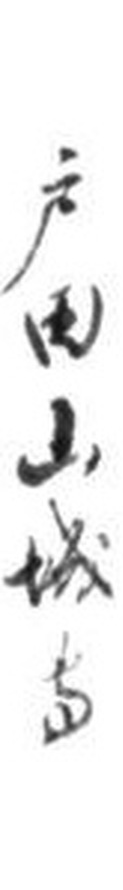戸田山城守
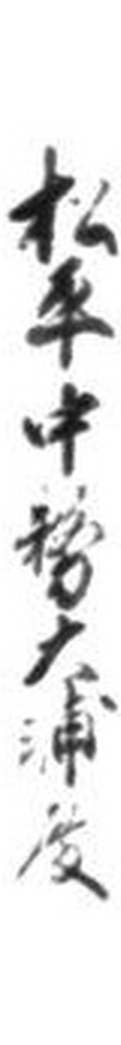松平中務大輔殿
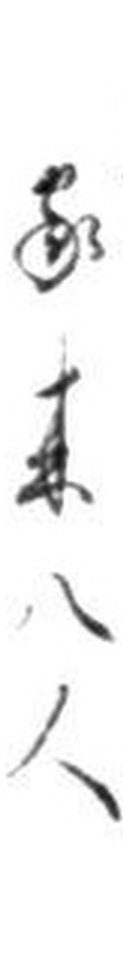家来八人
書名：家譜 三十五 宗昌公 従享保六年到同七年
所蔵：福井県文書館 Fukui Prefectural Archives
